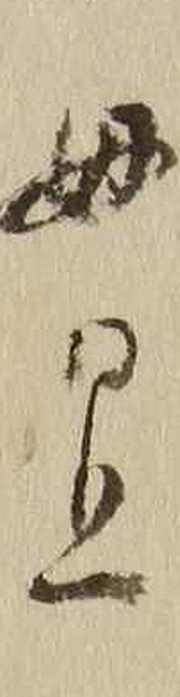母同上
